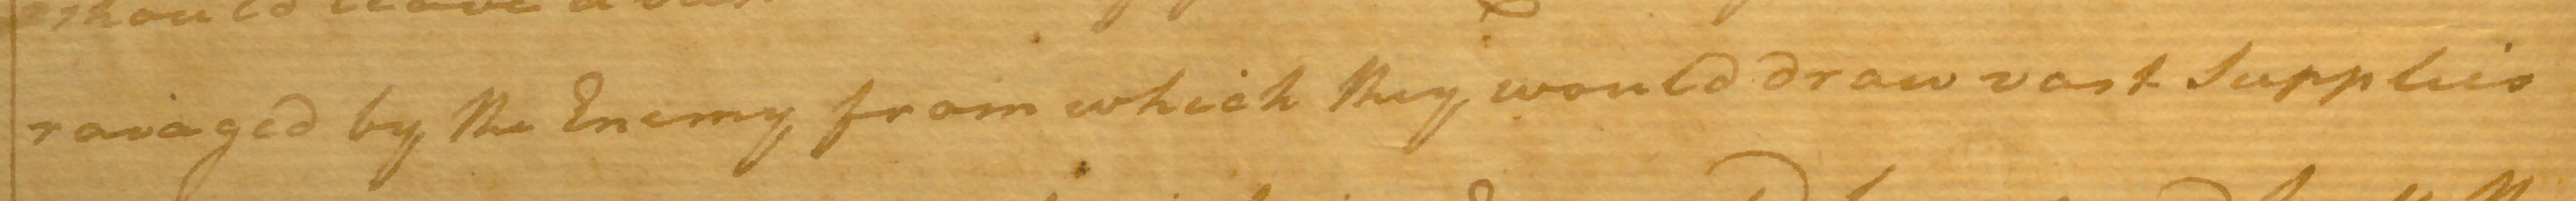ravaged by the Enemy from which they would draw vast Supplies
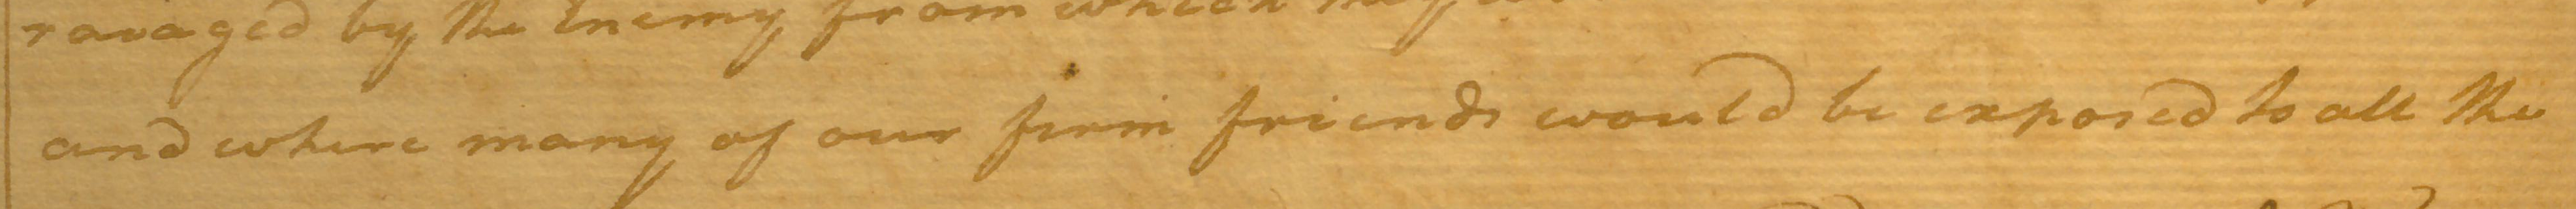and where many of our firm friends would be exposed to all the
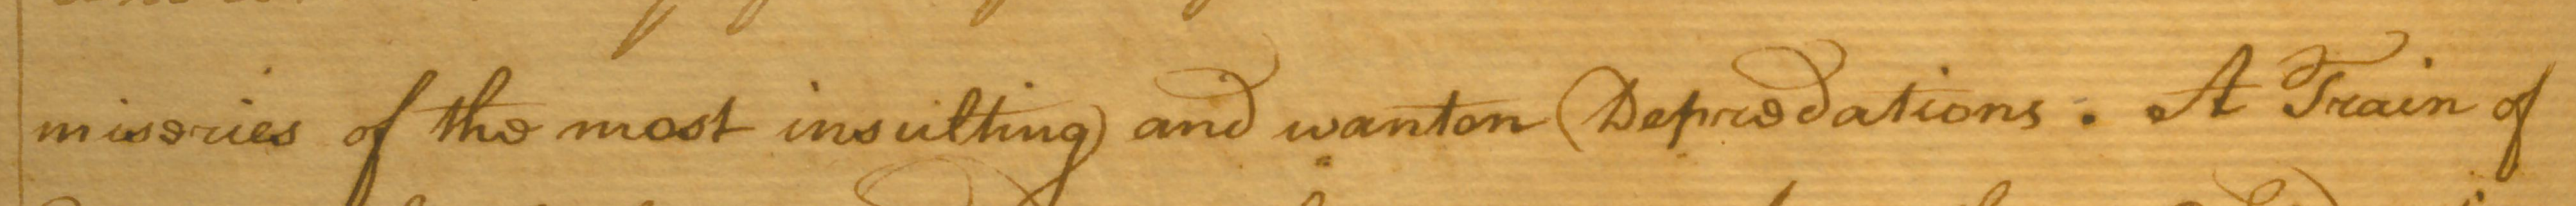miseries of the most insulting and wanton Depredations. A Train of
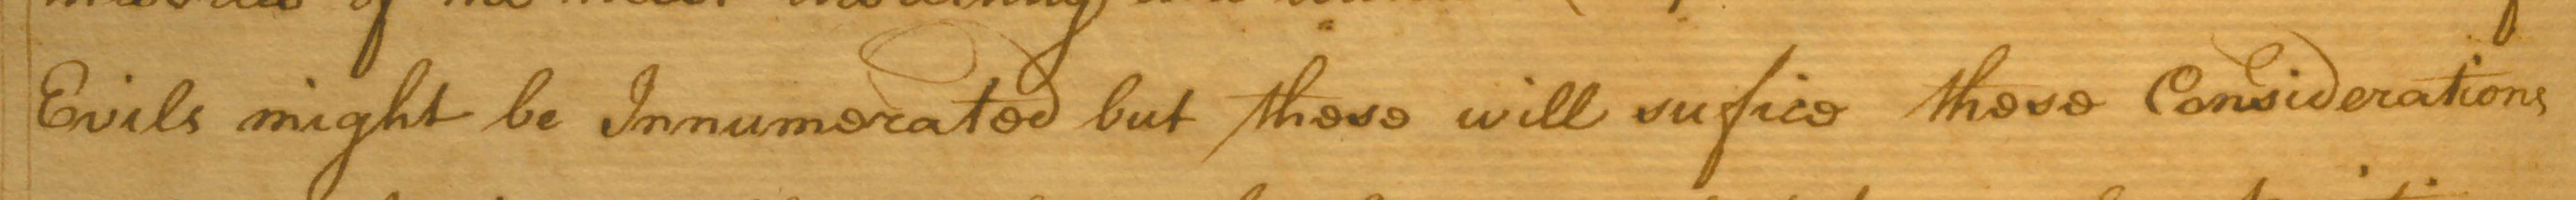Evils might be Innumerated but these will sufice these Considerations
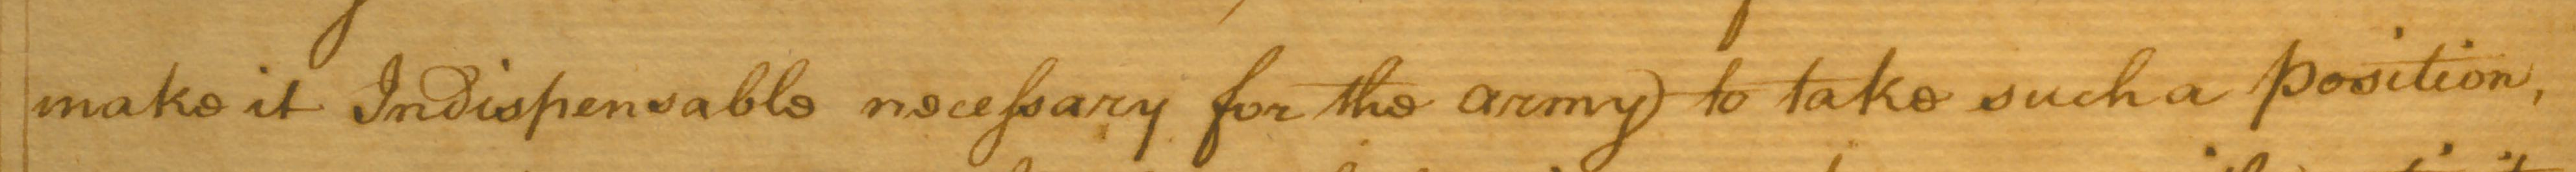make it Indispensable necessary for the army to take such a position.
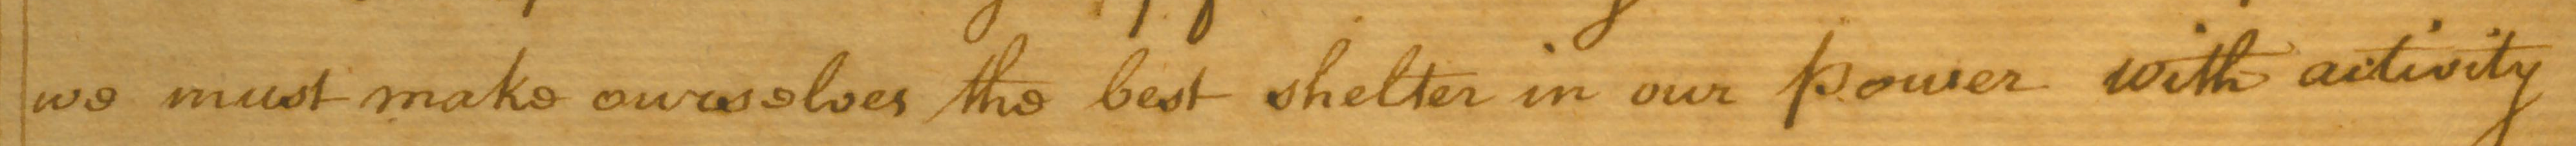we must make ourselves the best shelter in our power with activity
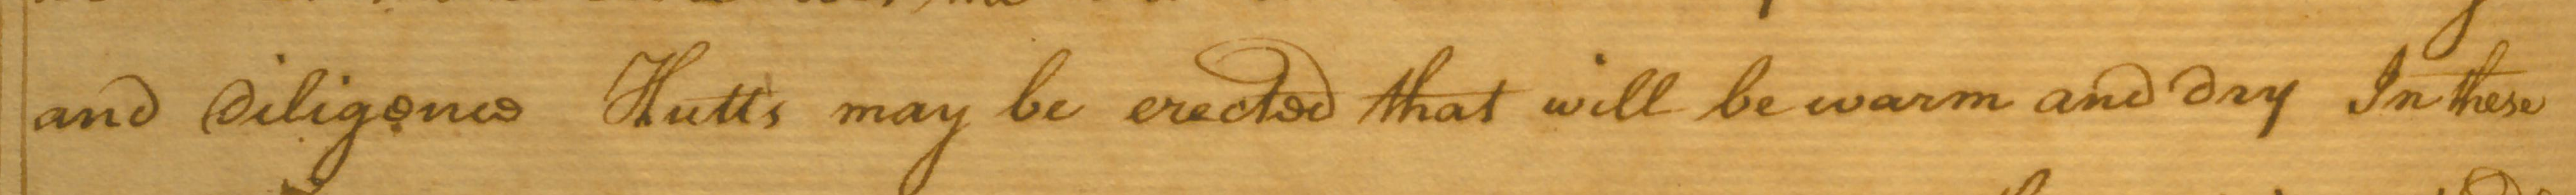and diligence Hutts may be erected that will be warm and dry In these
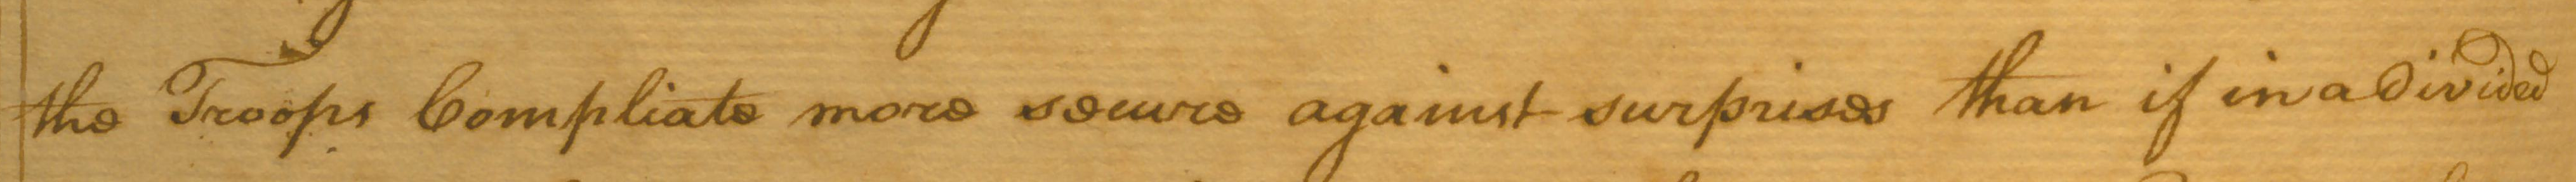the Troops Compliate more secure against surprises than if in a divided
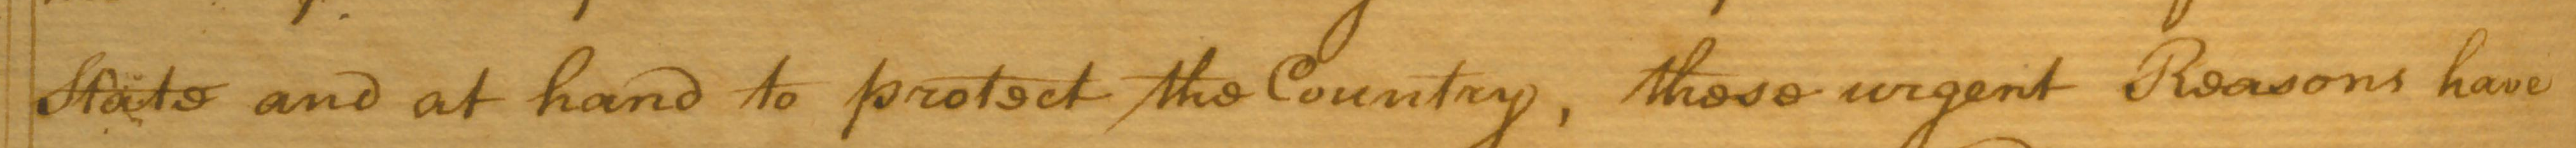State and at hand to protect the Country, these urgent Reasons have
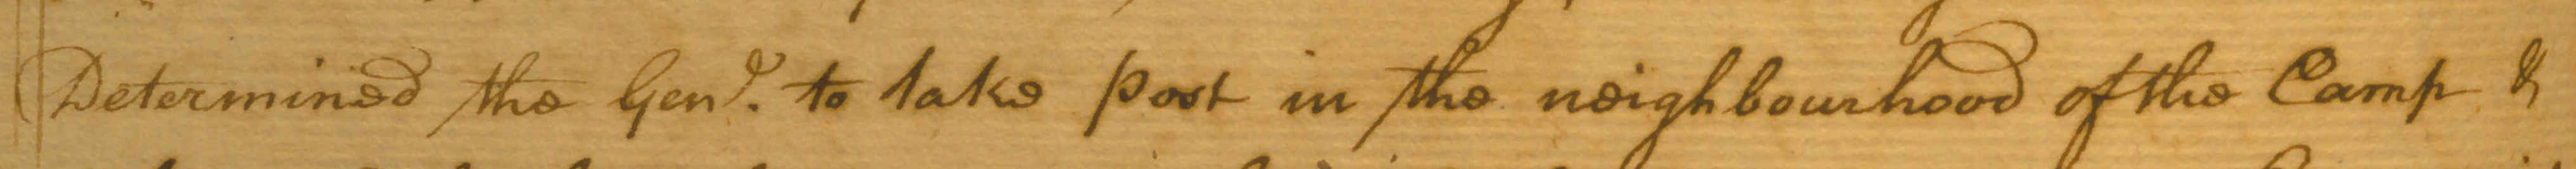Determined the Gen^l. to take post in the neighbourhood of the Camp &
